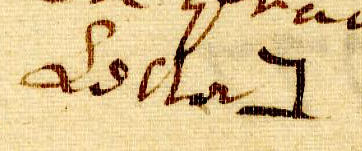Letter)
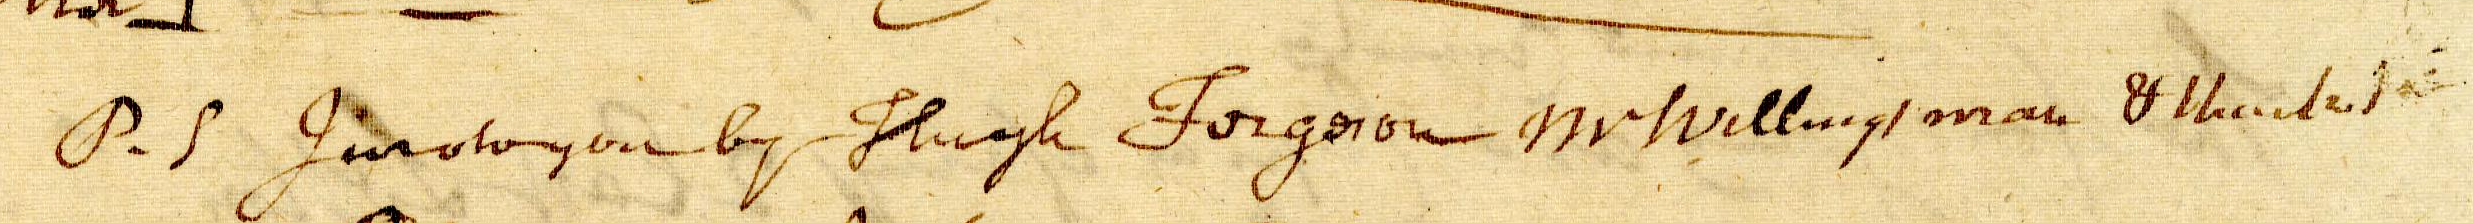P.S I wrote you by Hugh Fergeson M^r Willings man & thank
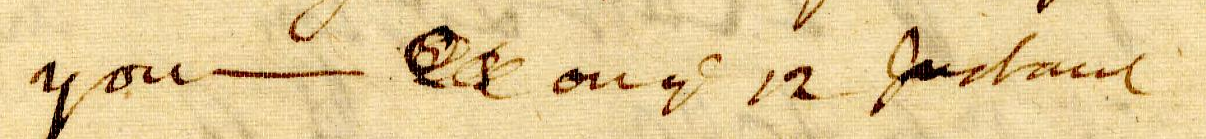you- [__] on y^e 12 Instant
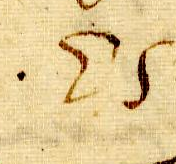ES
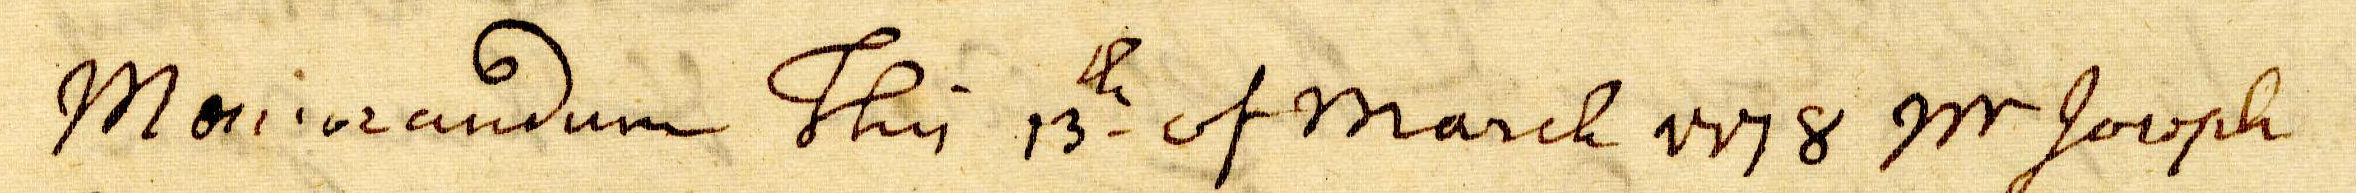Memorandum This 13^th of March 1778 Mr Joseph
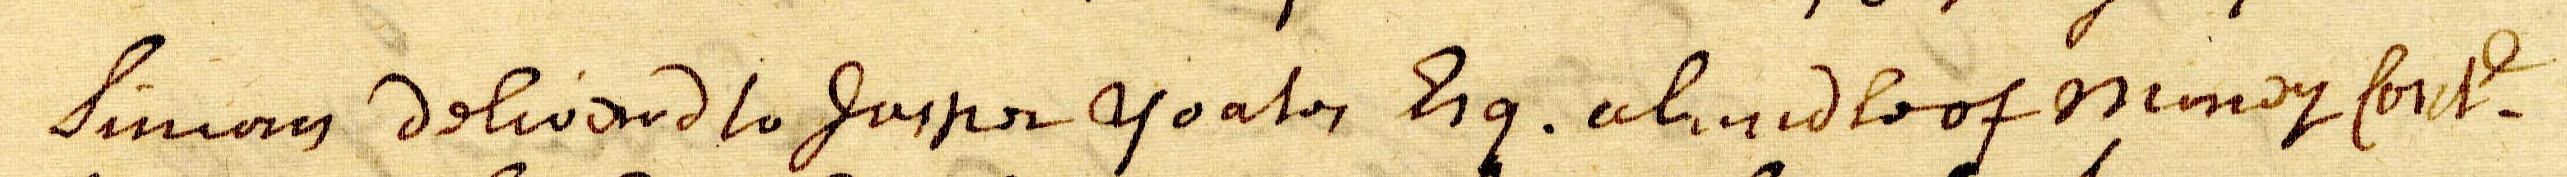Simons deliverd to Jasper Yeates Esq. a bundle of money Cont^l.
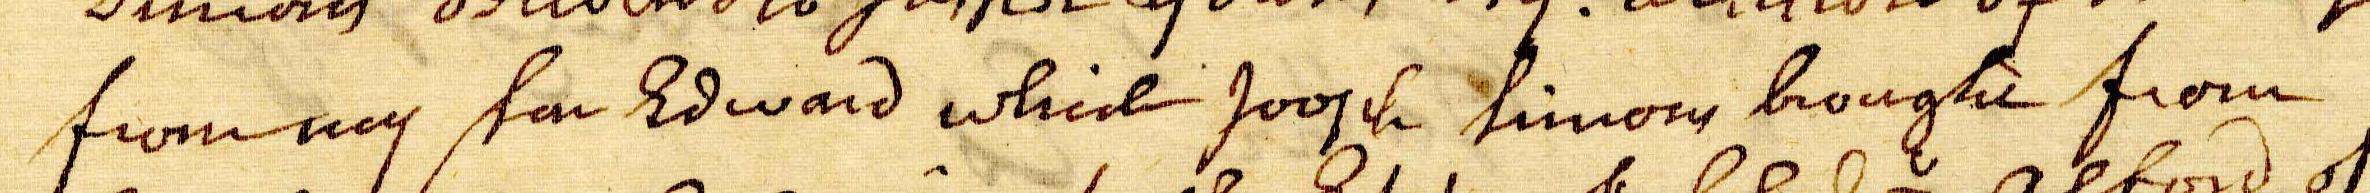from my son Edward which Joseph Simons brought from
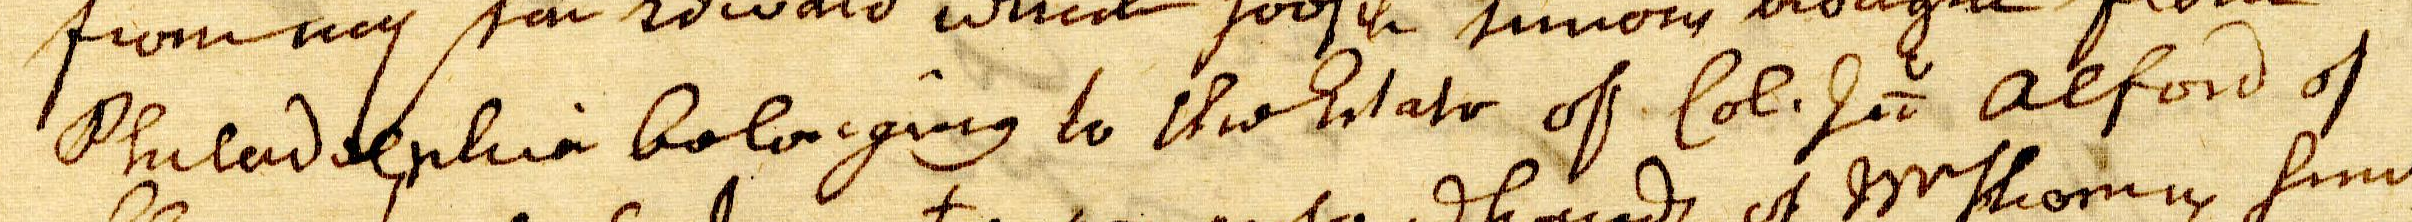PhiladIplia beloging to the Estate of Col. Jn^o Alford of
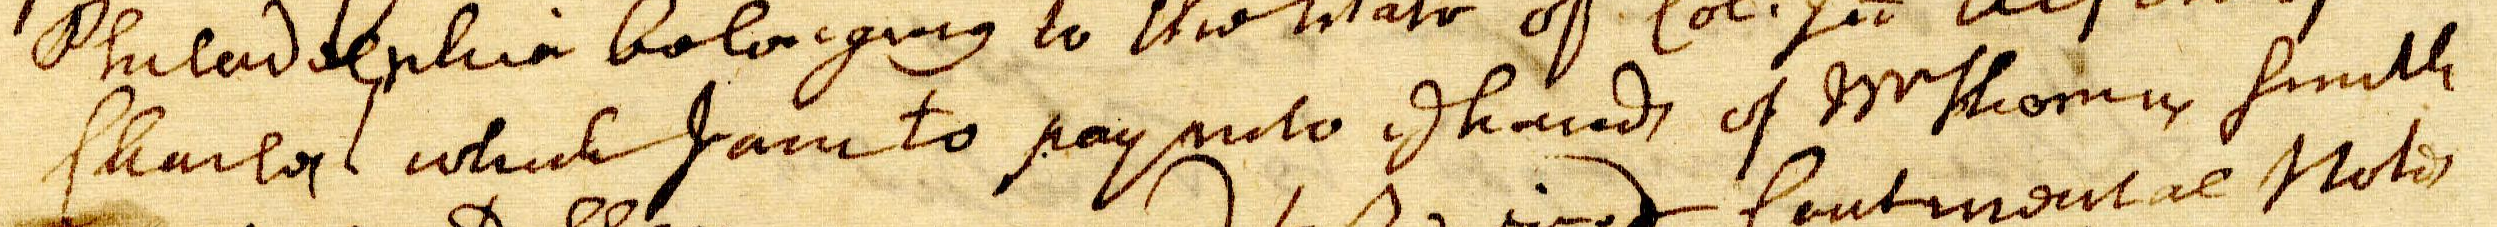Chester which I am to pay note y^e hands of M^r Thomas Smith
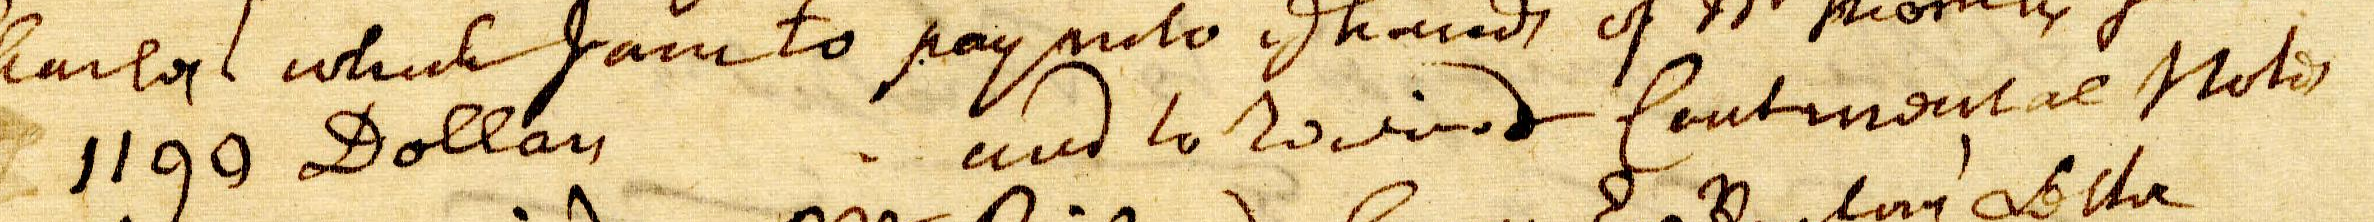1199 Dollars and to received Continental Notes
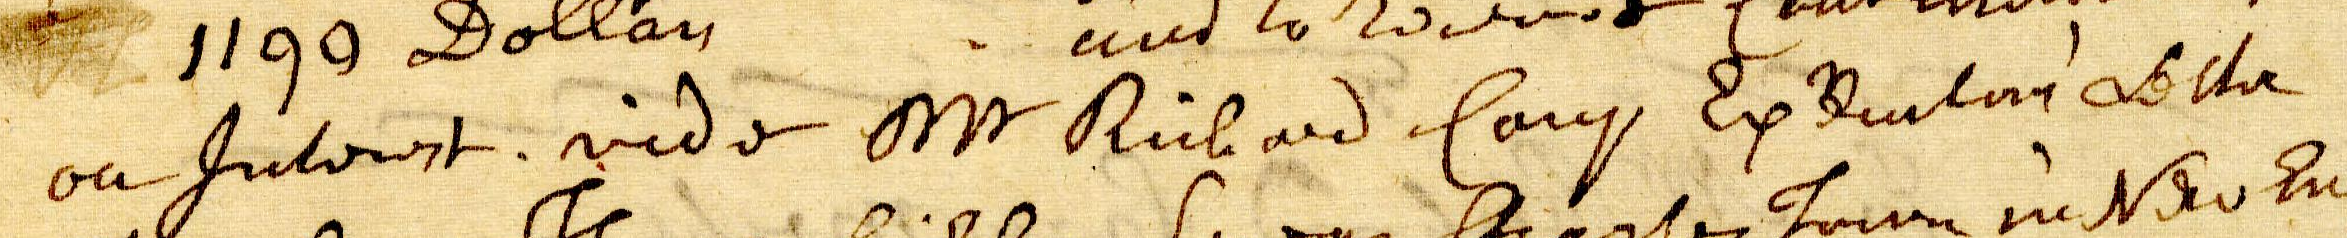on Interest vide Mr Richard Cary Ex Rectors' Letter
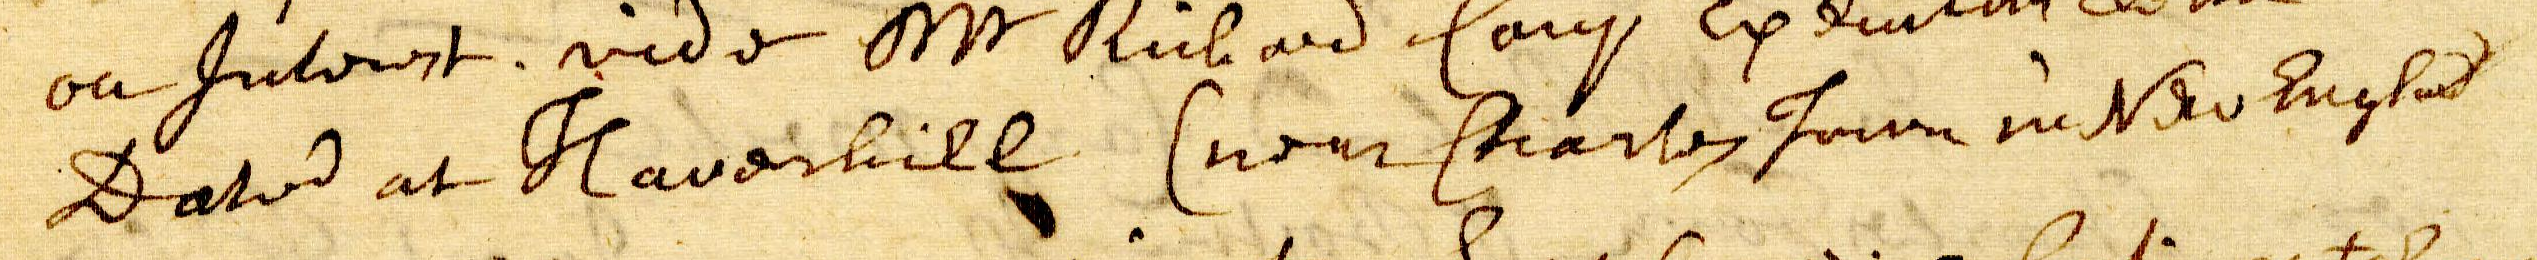Dated at Haverhill (near Charles Town in New England
